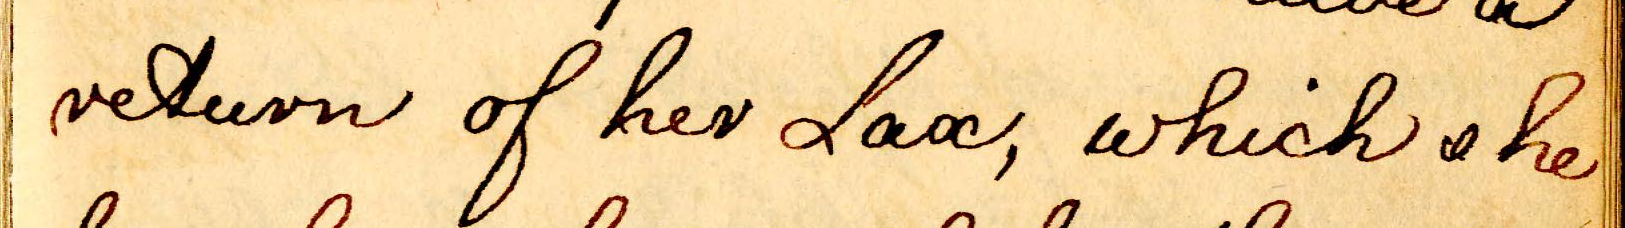return of her Lax, which she
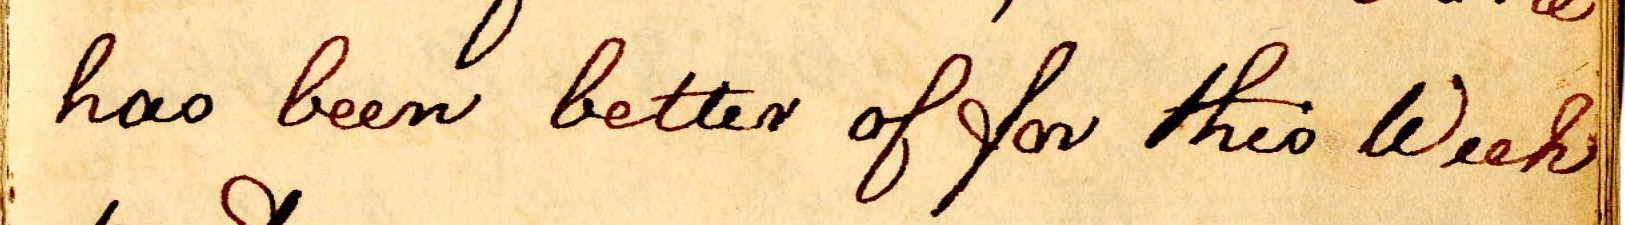has been better of for this Week
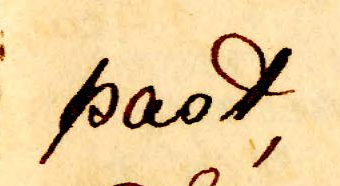past,
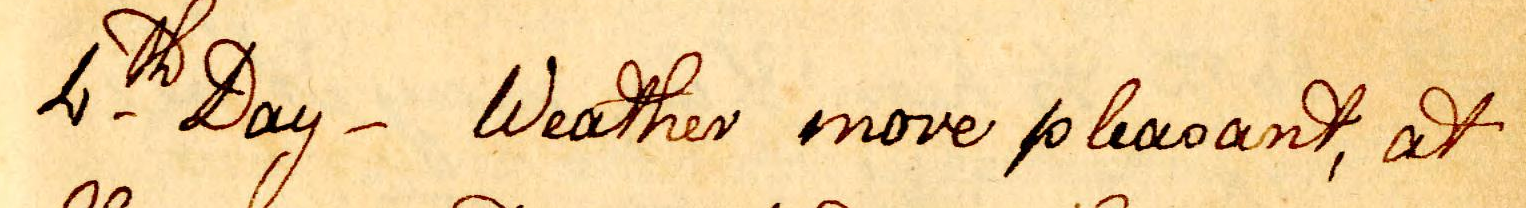4^th Day- Weather more pleasant, at
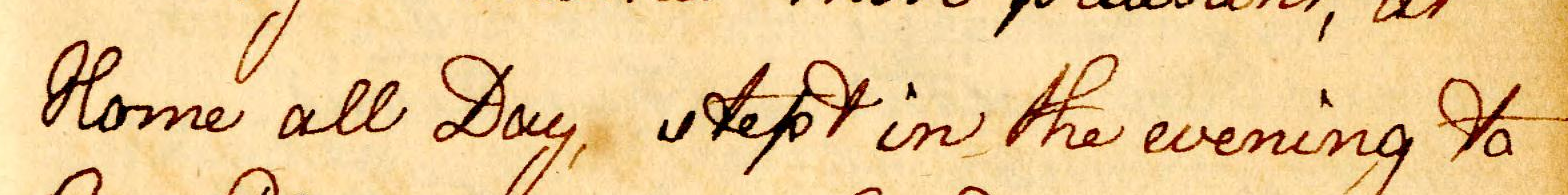Home all Day, stept in the evening to
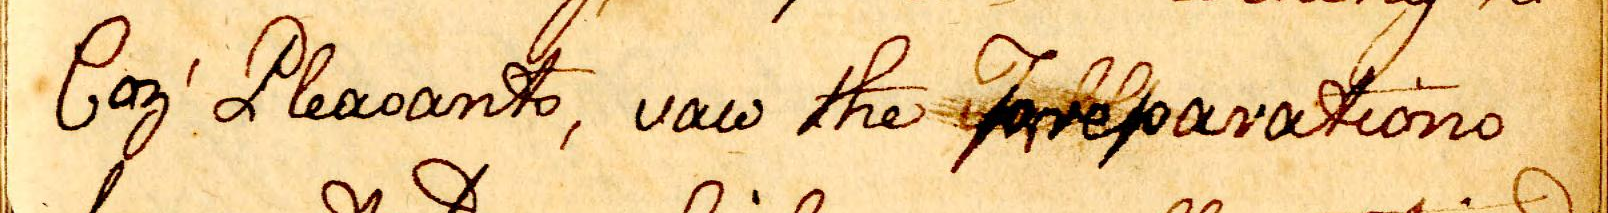Coz' Pleasants, saw the preparations
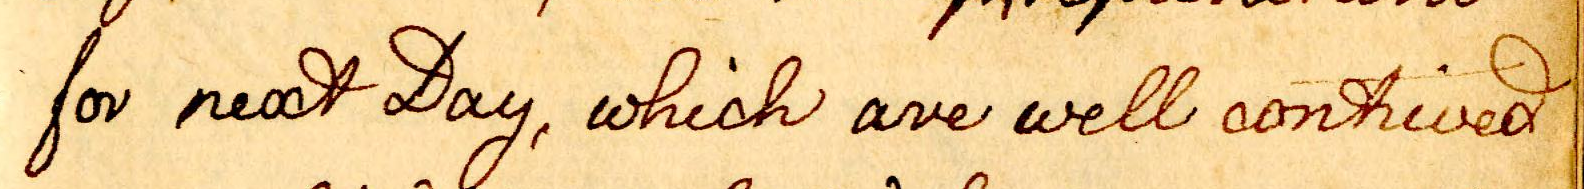for next Day, which are well contrived
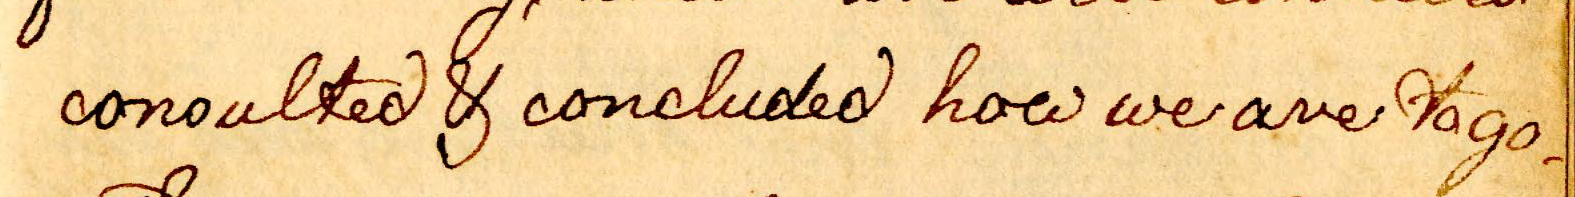consulted & concluded how we are to go-
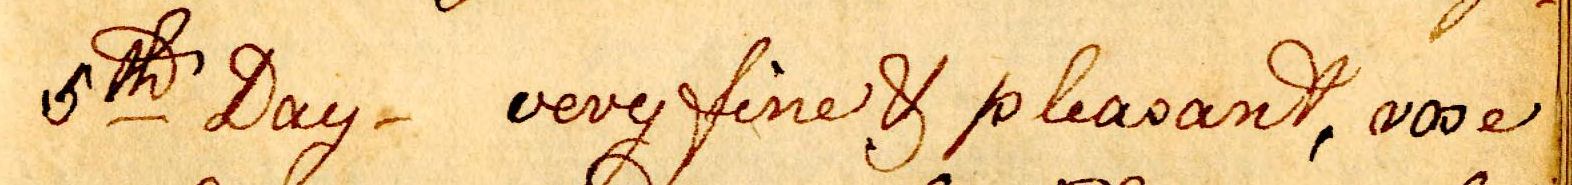5^th Day- very fine & pleasant, rose
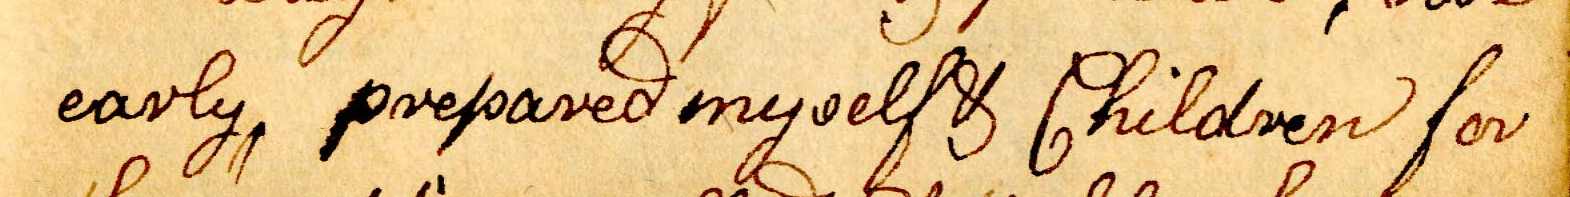early, prepared myself & Children for
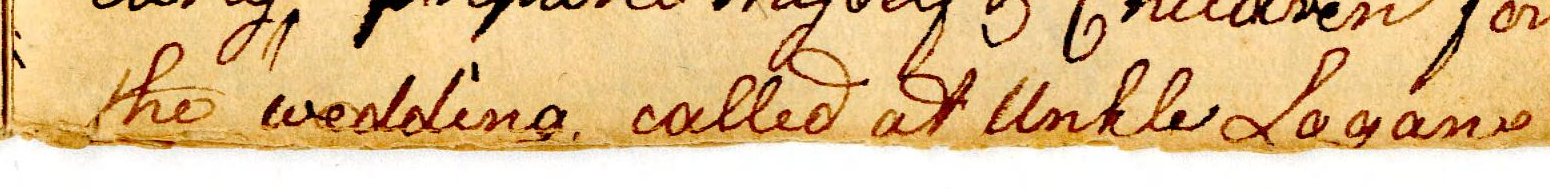the wedding called at Unkle Logans
